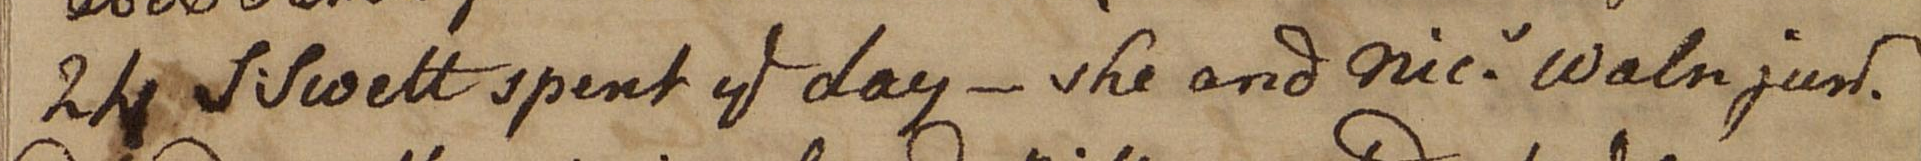24 S. Swett spent y^e day- she and Nic^s. Waln jun^r.
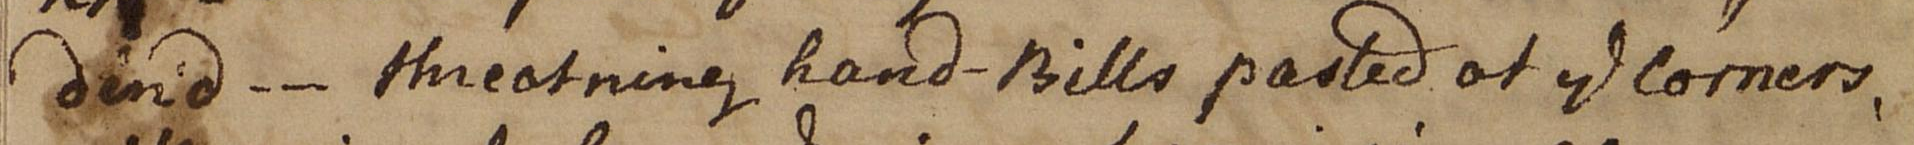din'd-- threatning hand- Bills pasted at y^e corners,
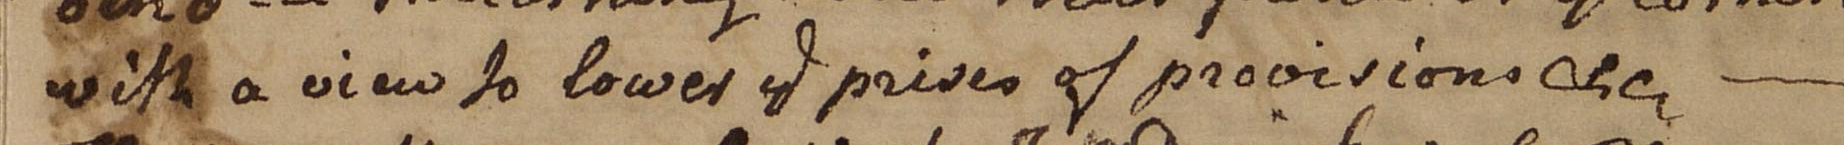with a view to lower y^e prises of provisions &c
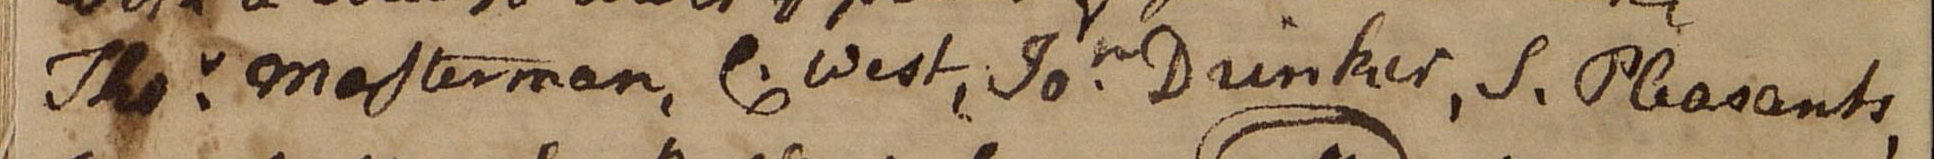Tho^s. Masterman, C. West, Jo^n. Drinker, S. Pleasants,
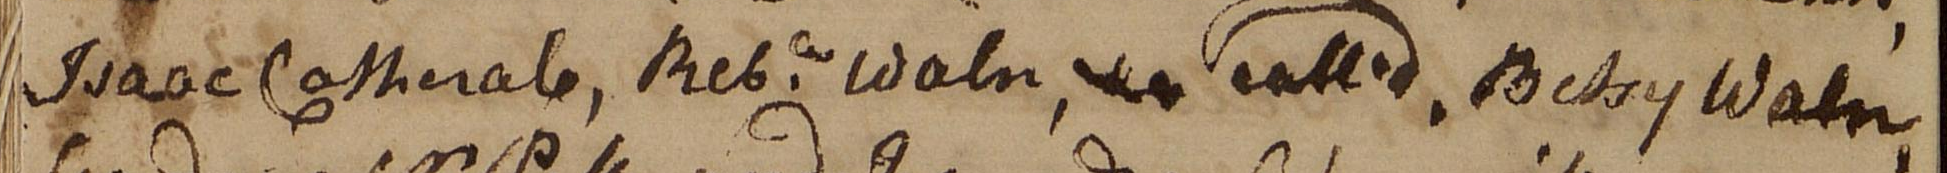Isaac Catheral, Reb^a. Waln, call'd, Betsy Waln,
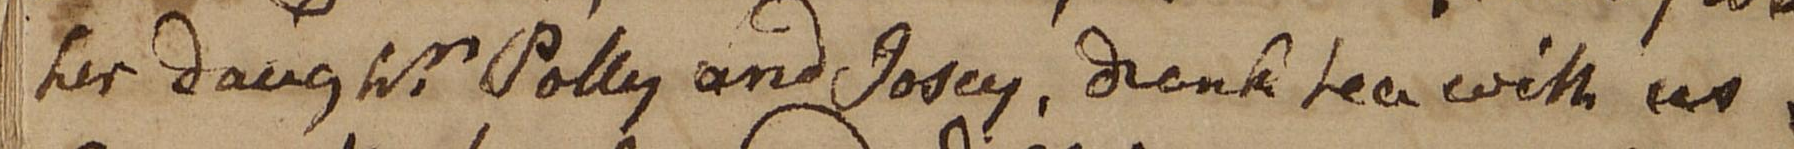her daugh^r. Polly and Josey, drank tea with us
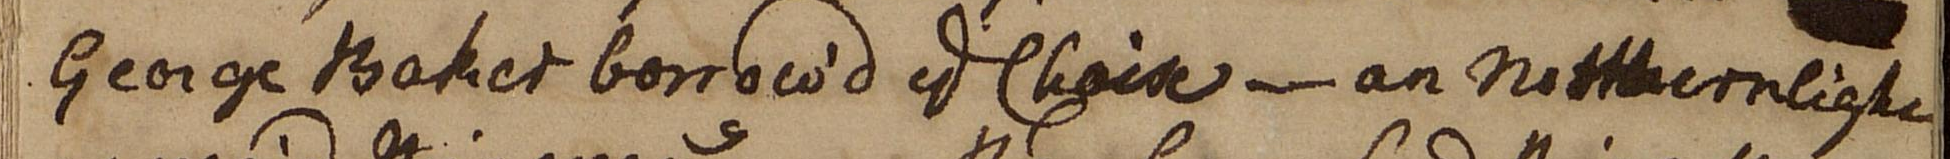George Baker borrow'd y^e Chaise- an Northernlighs
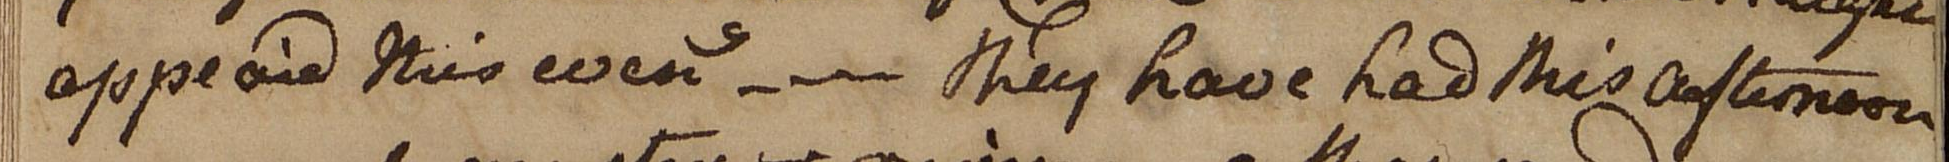appear'd this even^g-- they have had this afternoon
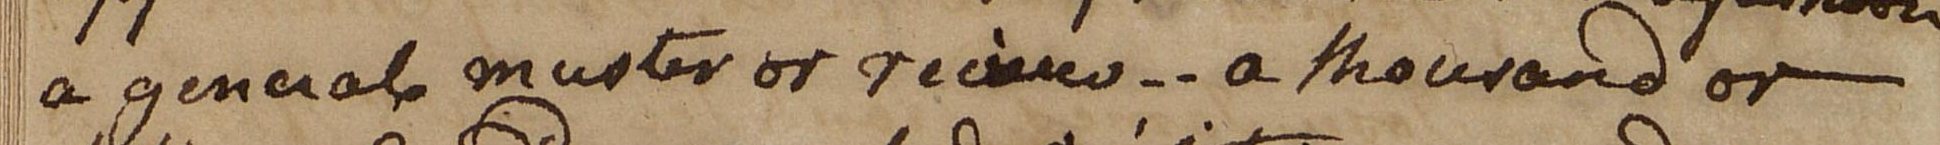a general muster or revise - a thousand or
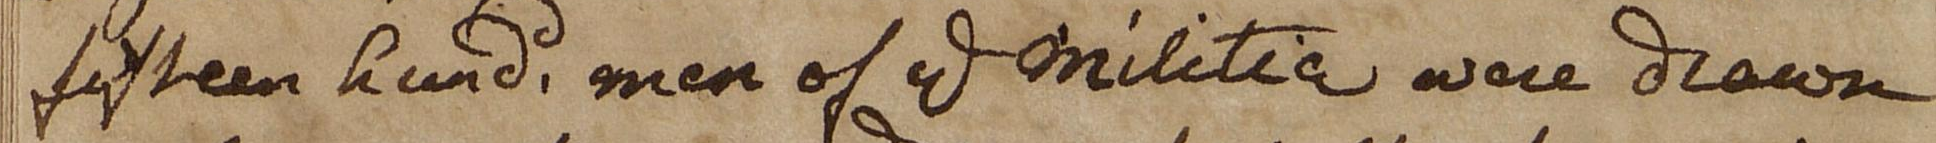fifteen hund^d. men of y^e militia were drawn
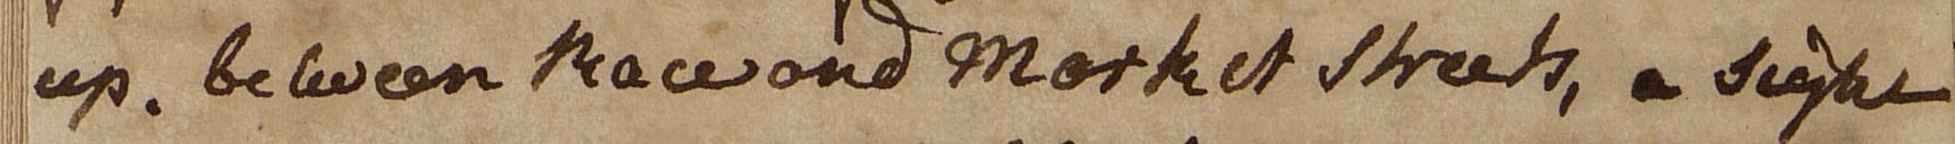up. between Race and Market Streets a sight
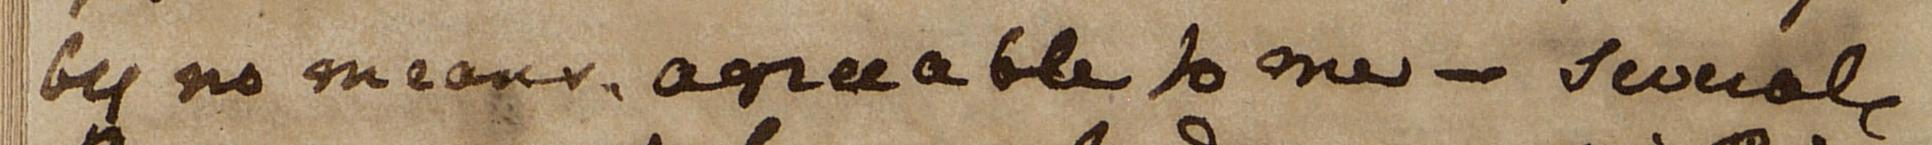by no means. agreeable to me- several
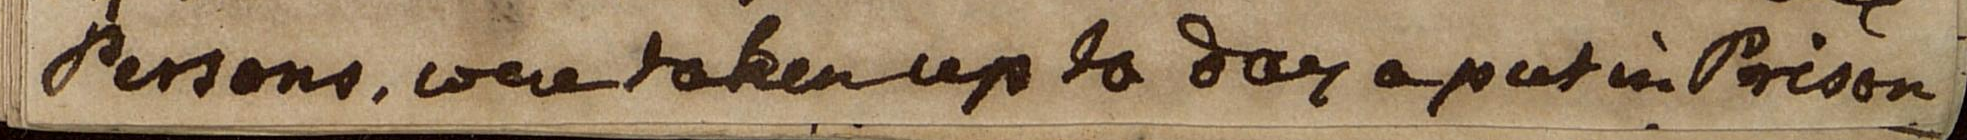Persons, were taken up to day a put in Prison
